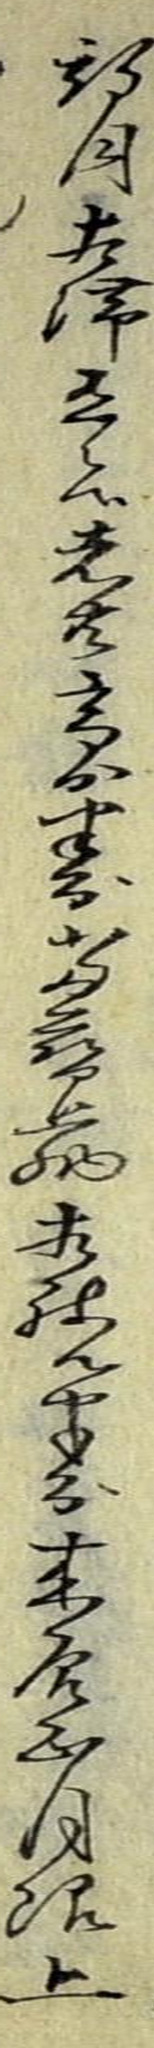期月相滞有之候者共高ゟ半分当暮上納相残ル半分来辰正月限上
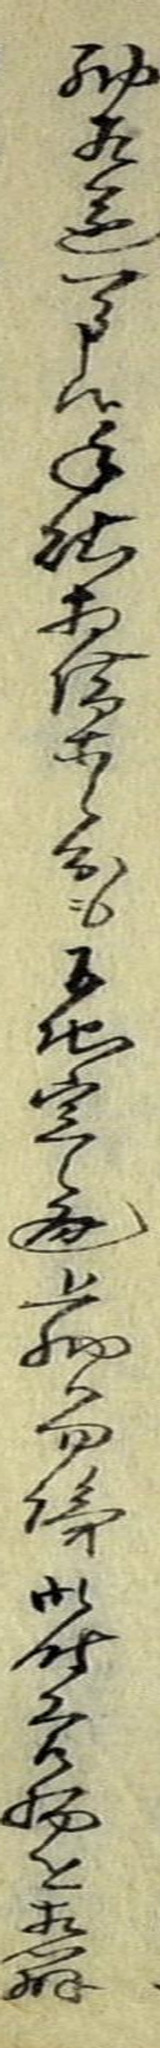納相達可申候年賦拝借等之分も下地定之通上納勿論御時節柄を相弁
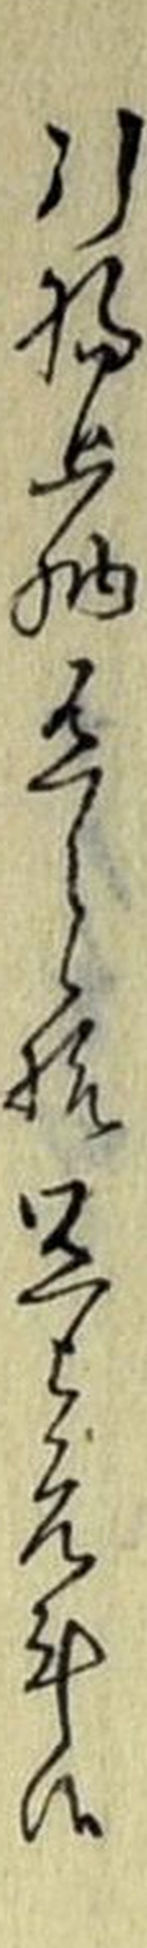引揚上納有之候様宜被取斗候
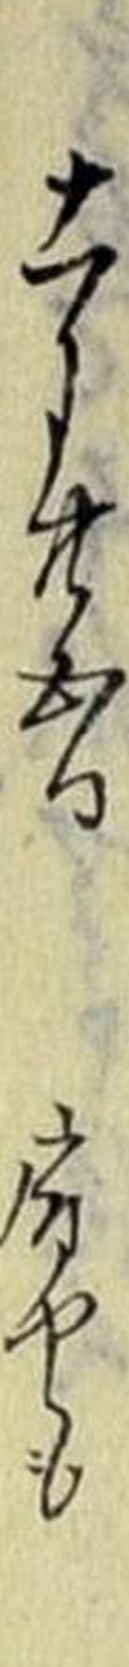十一月廿五日府中へも
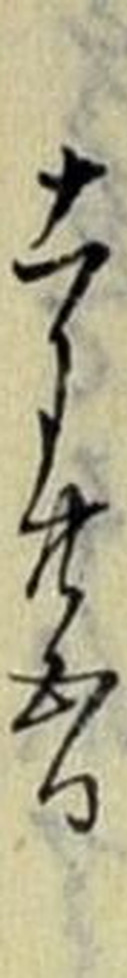十一月廿六日
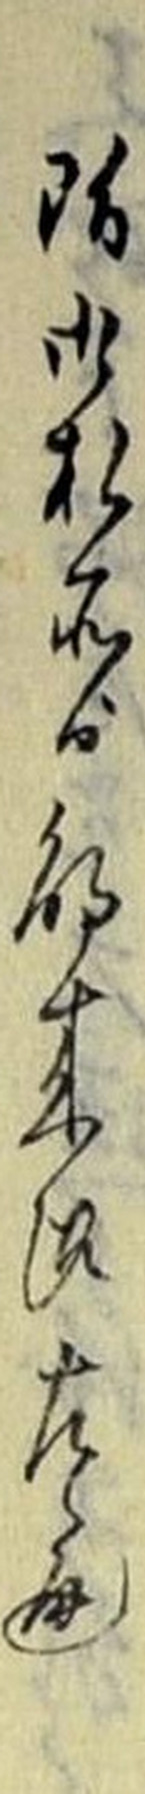附御札所ゟ触来趣左之通
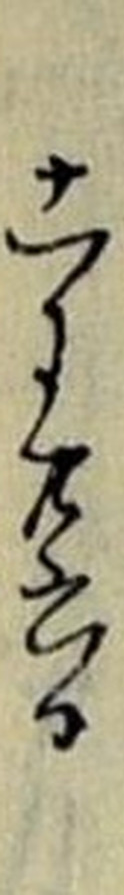十一月廿六日
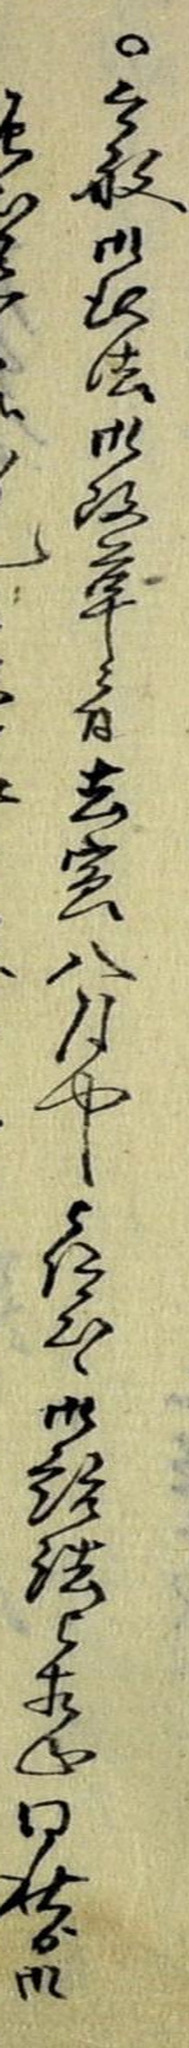○今般御趣法御改革に付去寅八月中被仰出候御趣法被相止同秋ゟ御
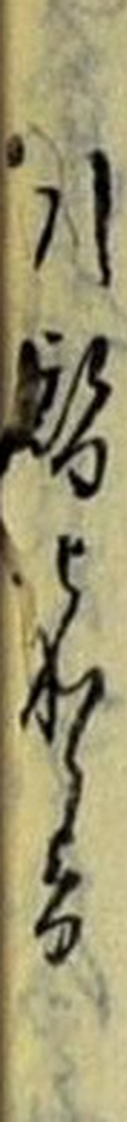引替被成候旨
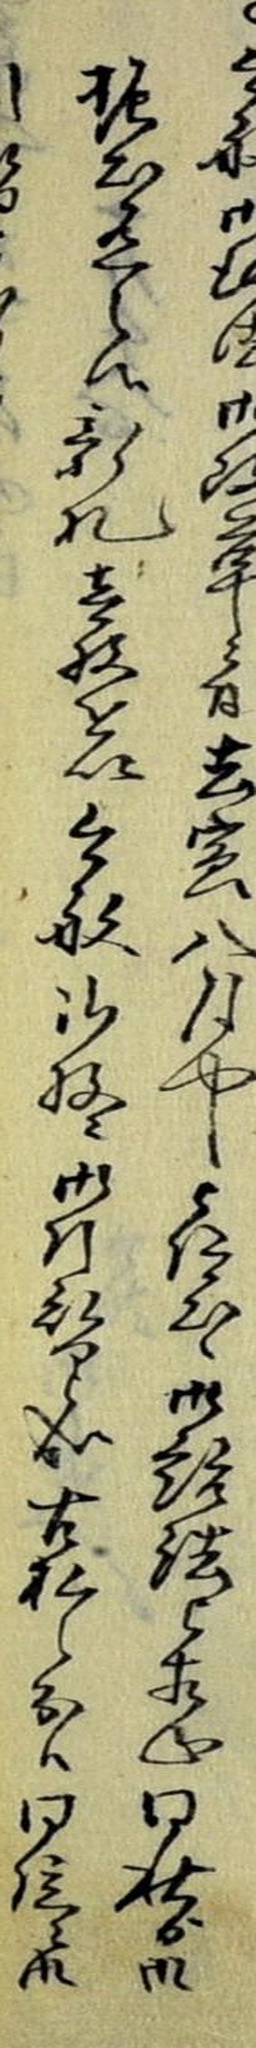振出有之候新札壱枚を以今般弐枚に御引替被成古札之分は同位に御
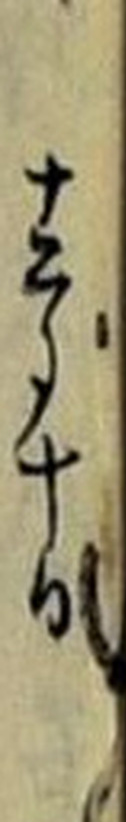十二月十日
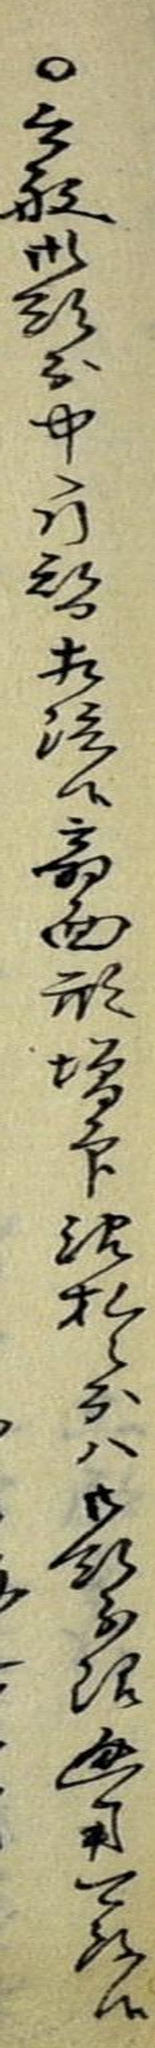○今般御領分中へ引替相渡候扇面形増印銀札之分は御領分限通用可致事
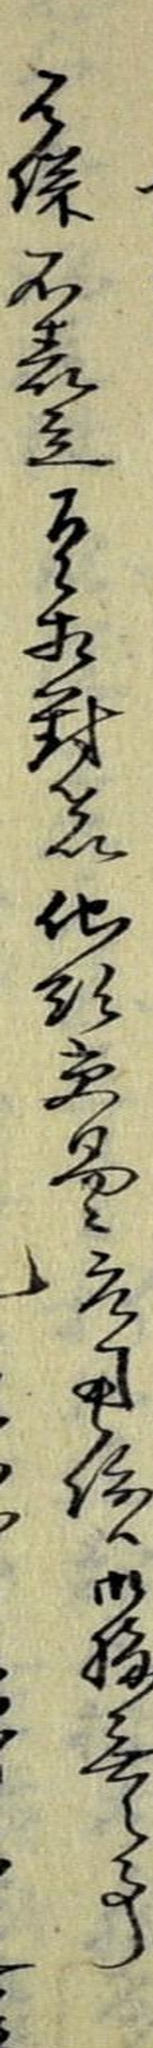乍併不表立下々相対を以他領交易に取用儀は御構無之事
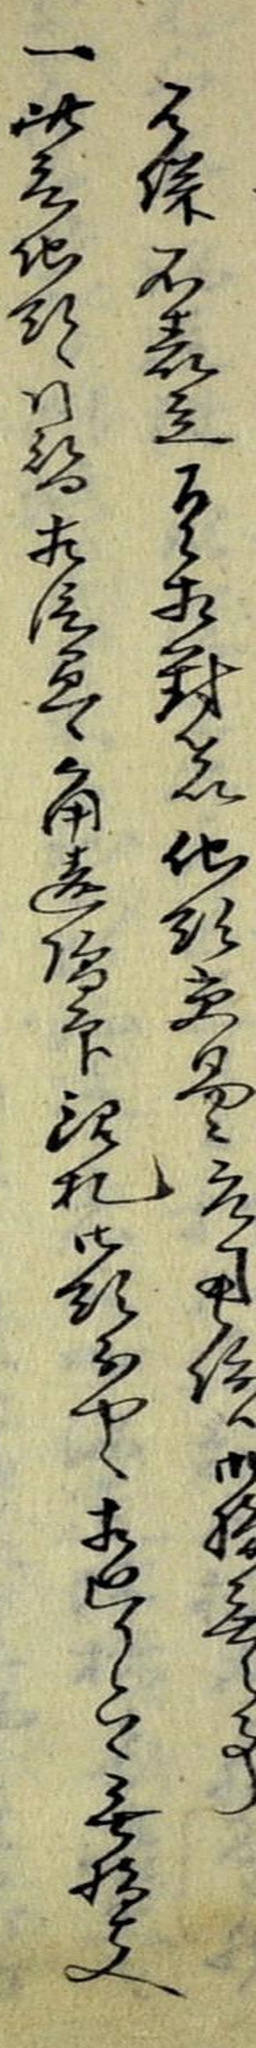一此度他領へ引替相渡置候角違増印銀札御領分中へ相廻候はヽ無指支
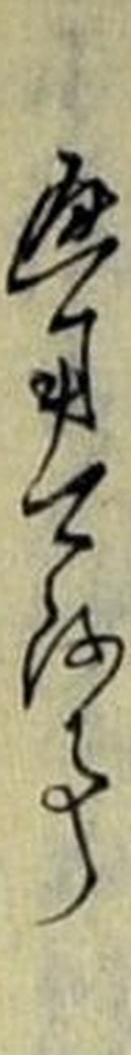通用可致事
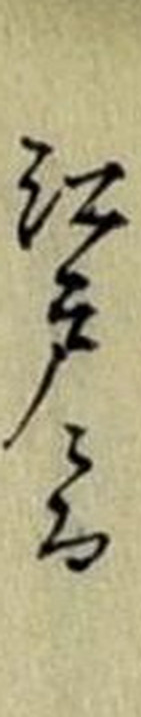江戸に而
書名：命令之部 六
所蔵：福井県文書館 Fukui Prefectural Archives
